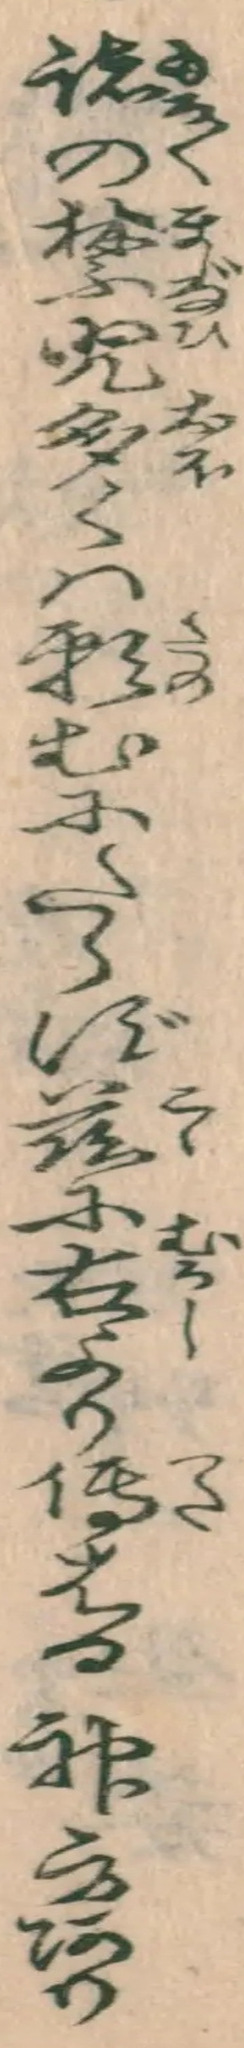・諸の禁呪多くは頼むにたらず茲に古より傳はる神方あり
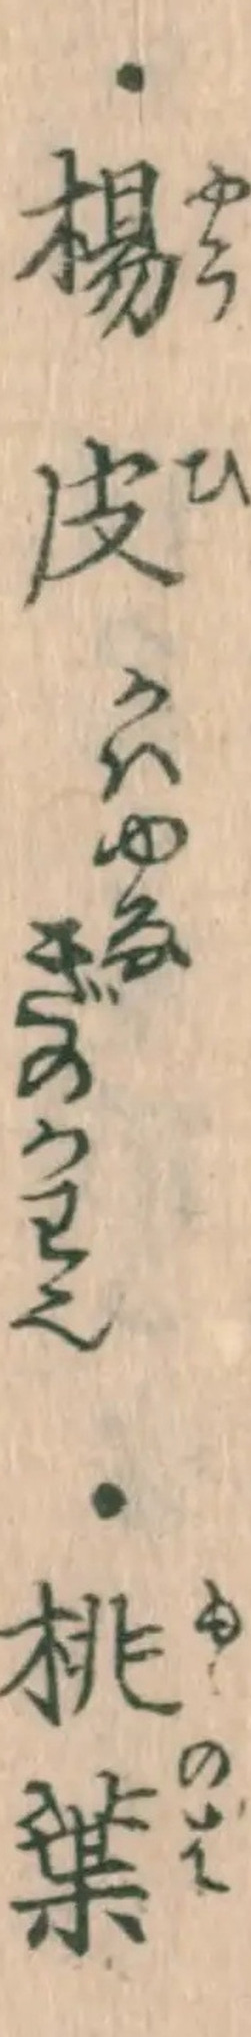・楊皮かはやなぎのかわ也・桃葉
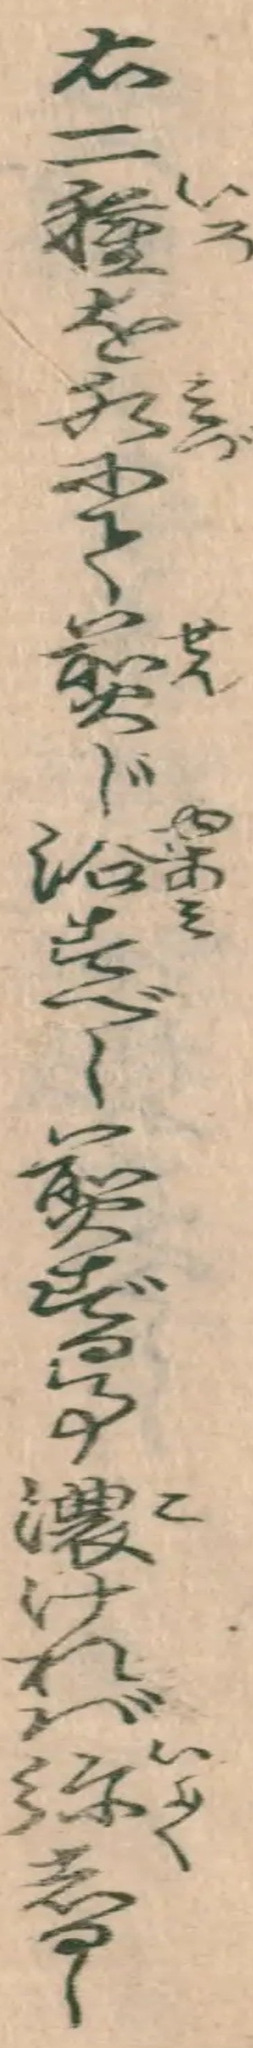右二種を水にて煎じ浴すべし煎ずる事濃ければ弥しるし
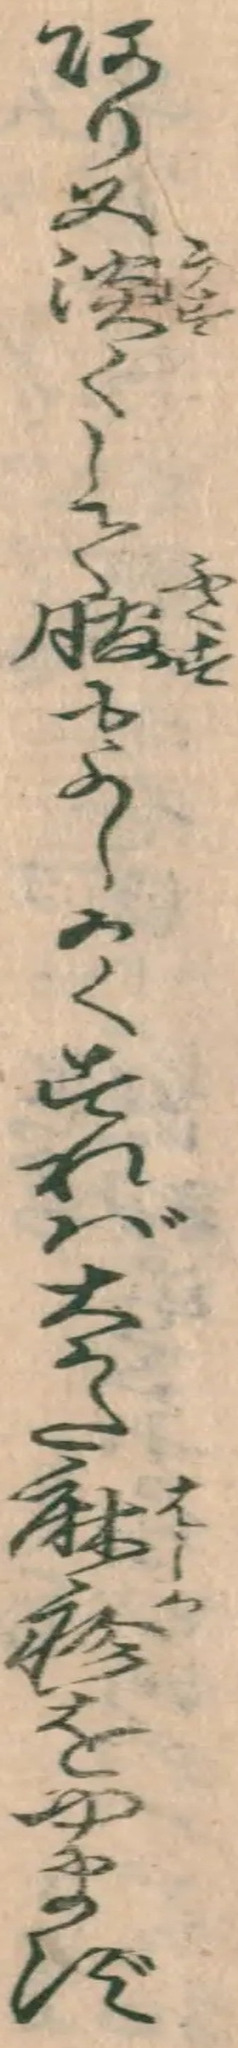あり又淡くして服もよしかくすれば大かた麻疹をやまず
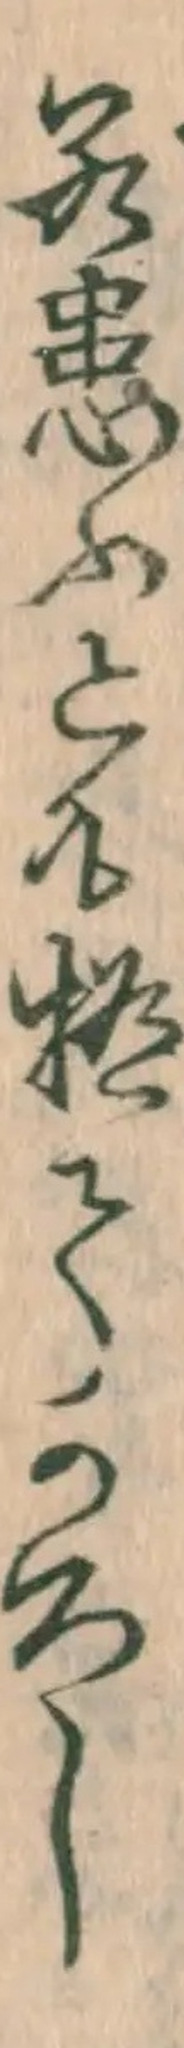若患ふとも極てかろし
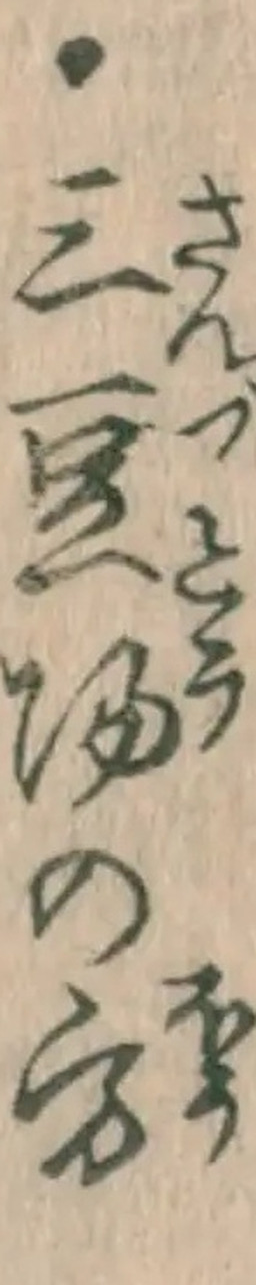・三豆湯の方
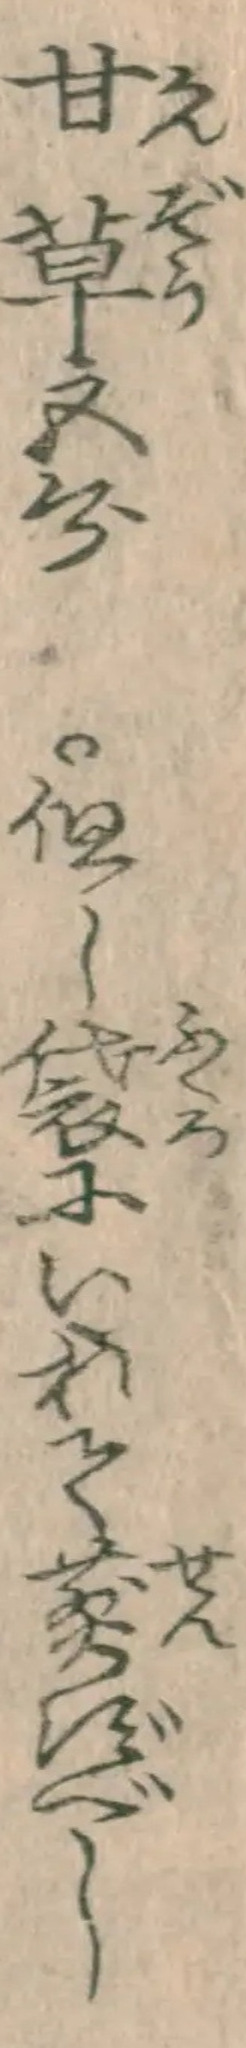甘草五分・但し袋にいれて煎ずべし
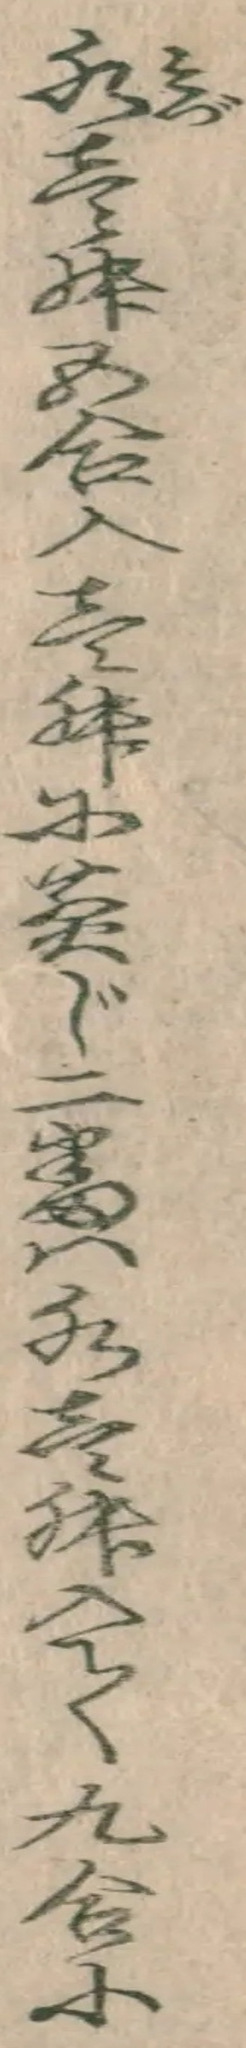水壱升五合入壱升に煎じ二番は水壱升入て九合に
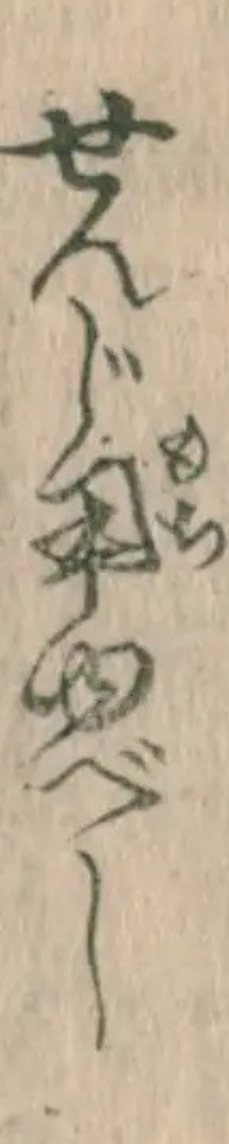せんじ用ゆべし
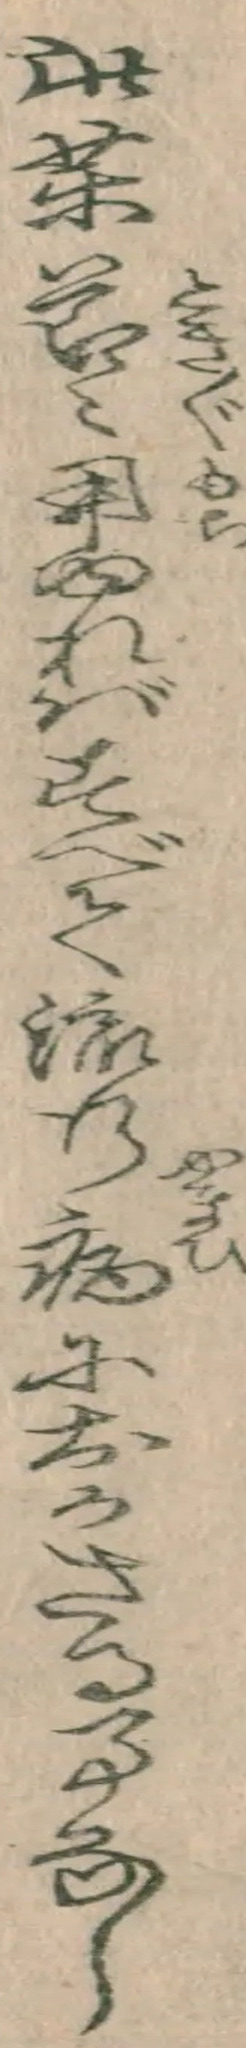此薬節々用ゆればすべて流行病におかさる事なし
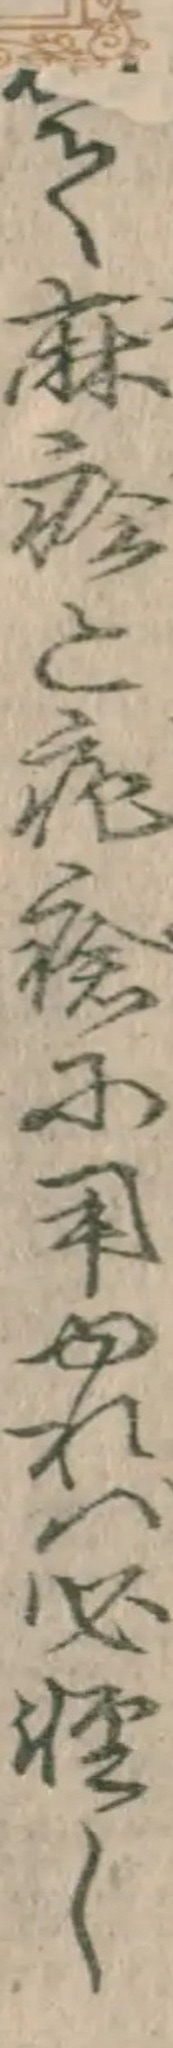て麻疹と疱瘡に用ゆれば必軽し
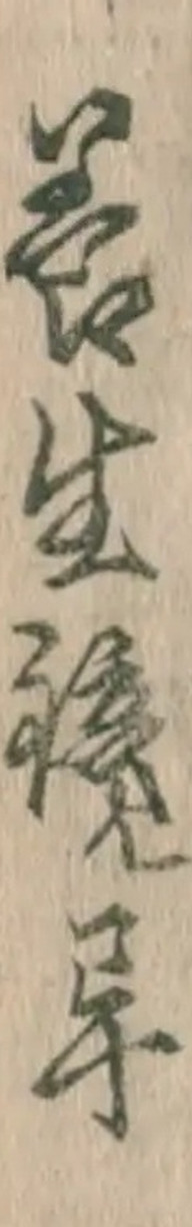養生鏡畢

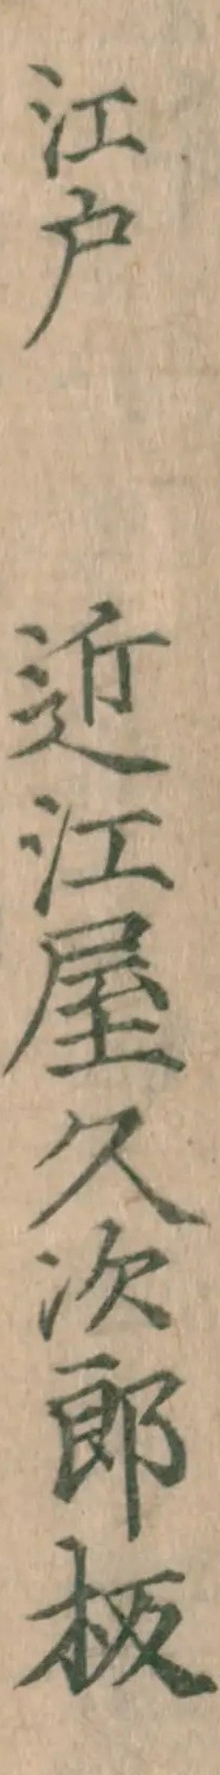江戸近江屋久次郎板
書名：麻疹養生鑑
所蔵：国立国会図書館 National Diet Library, JAPAN
